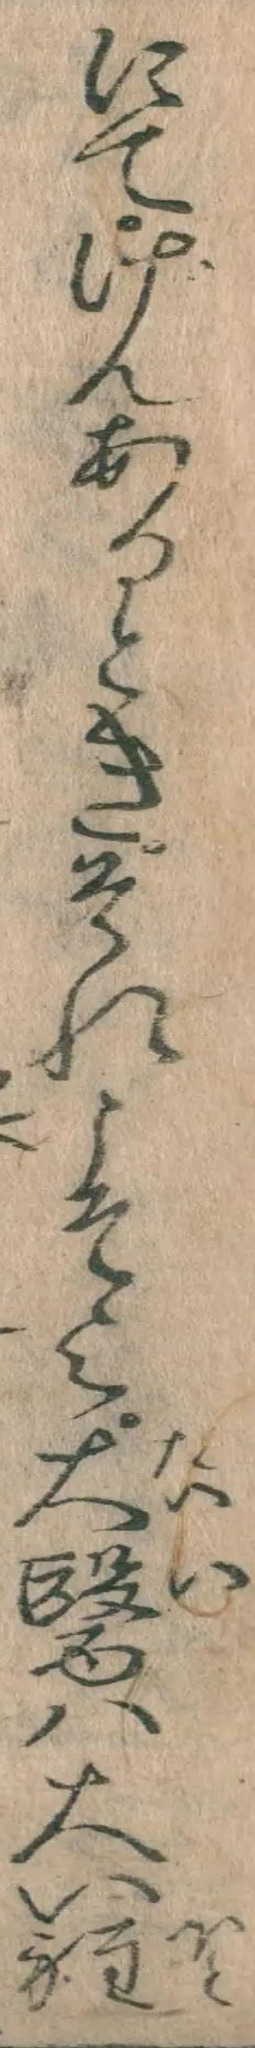にて、けんあるとき。それこそは。大医は大い程
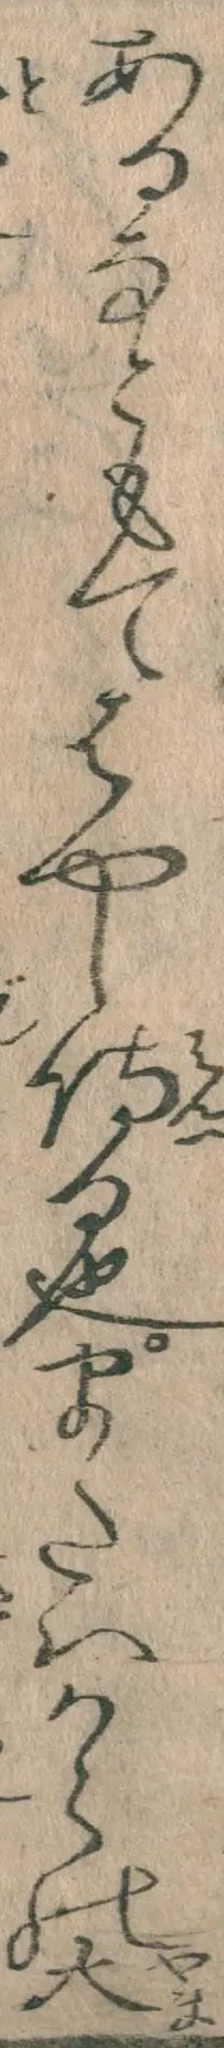あるなともてはやし侍る也。またはからの大
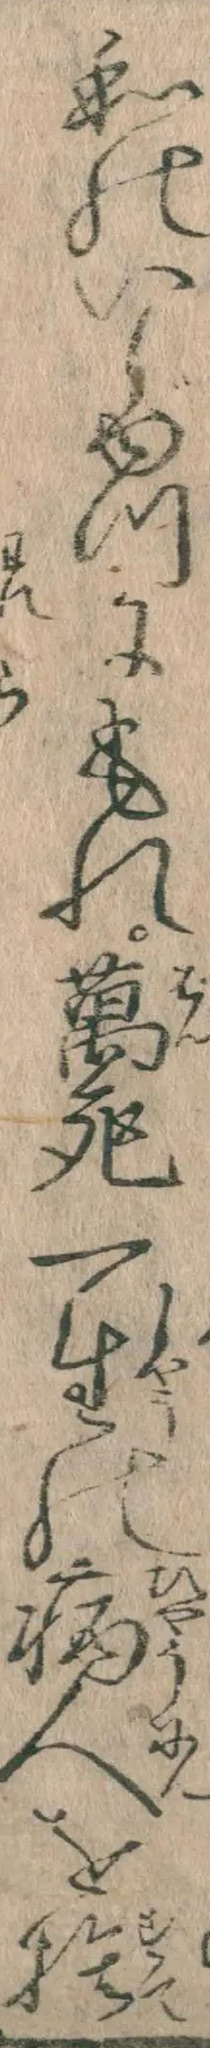和のいじゆつにもれ。万死一生の病人を捨
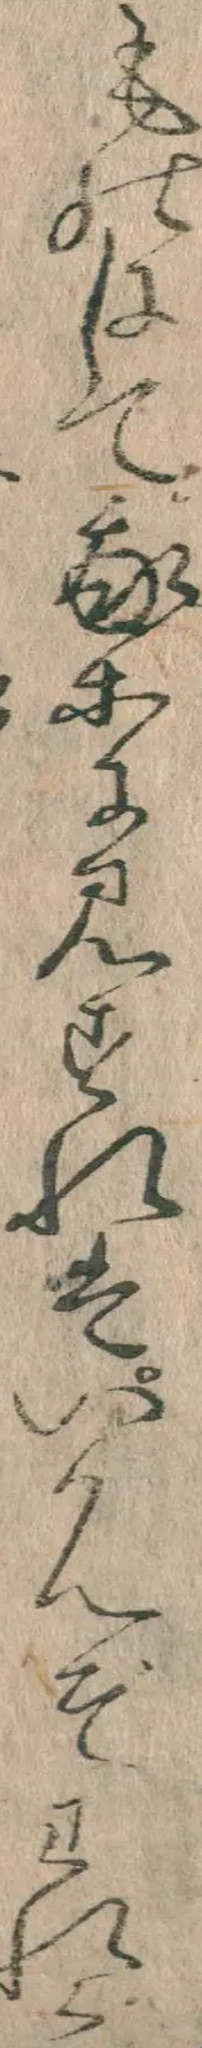ものにして我等に見すれは。いかんぞわれら
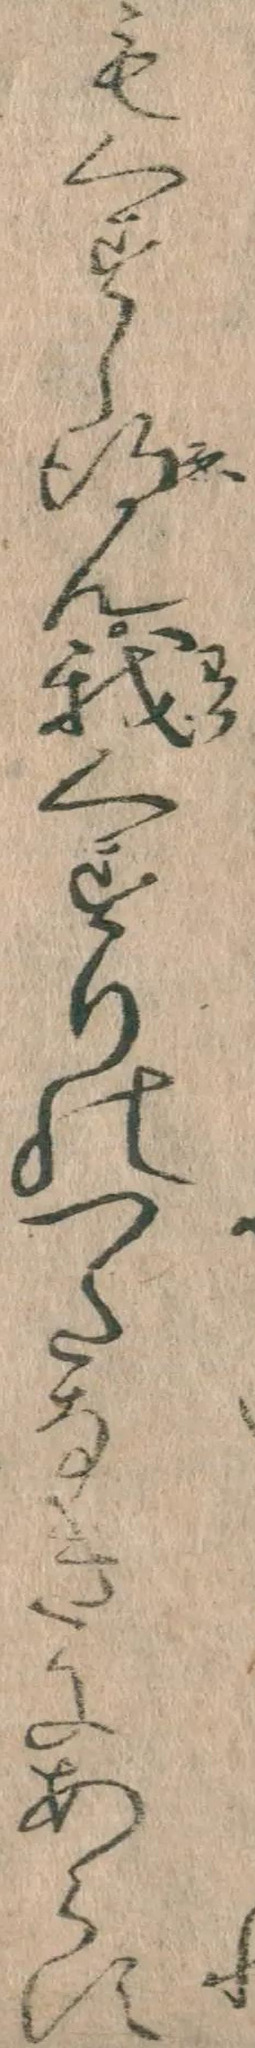もくすし得ん。我くすりのつたなきにあらす
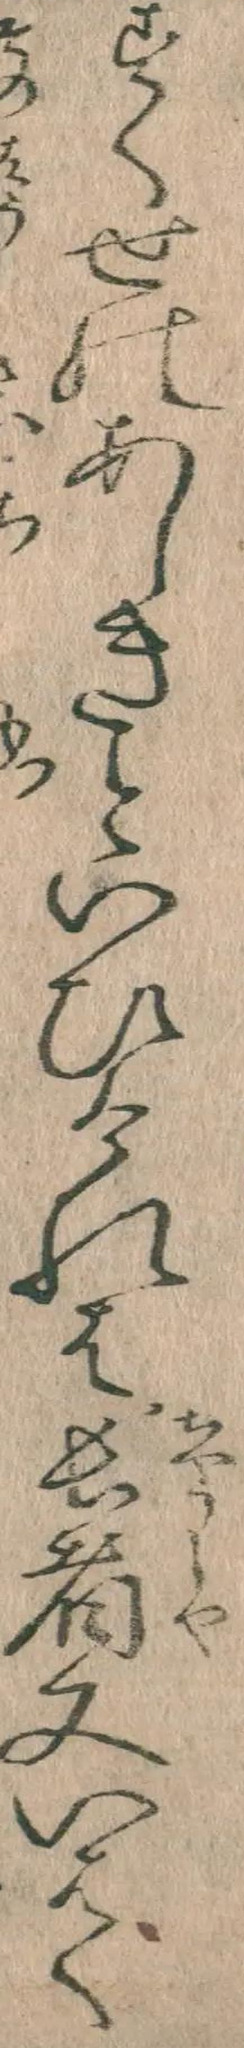すくせのあしきといひけれは、長者又いはく
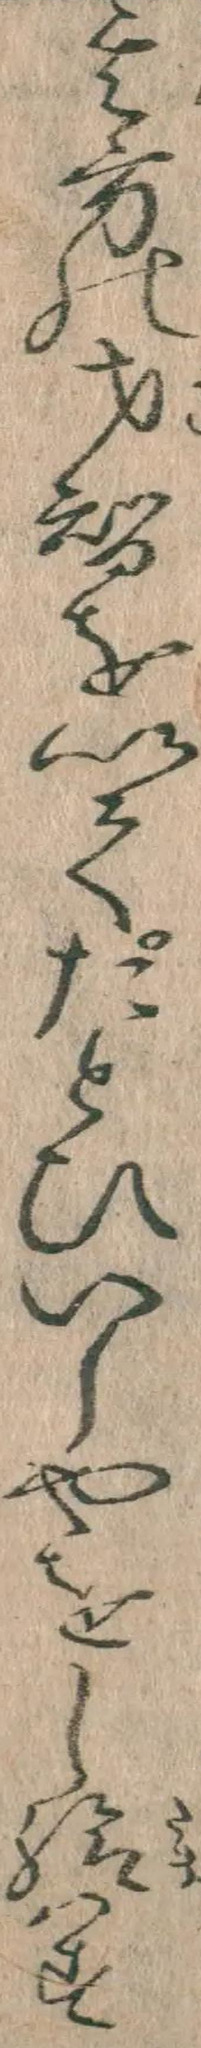其方の才智を以て。たとひいしやをし給はす
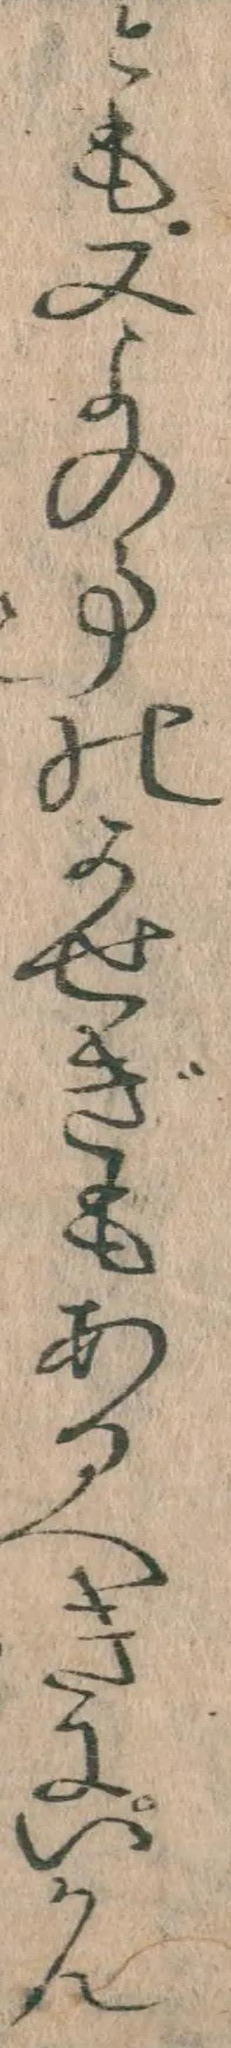とも、又よの事のかせぎもあるへきに。いかん
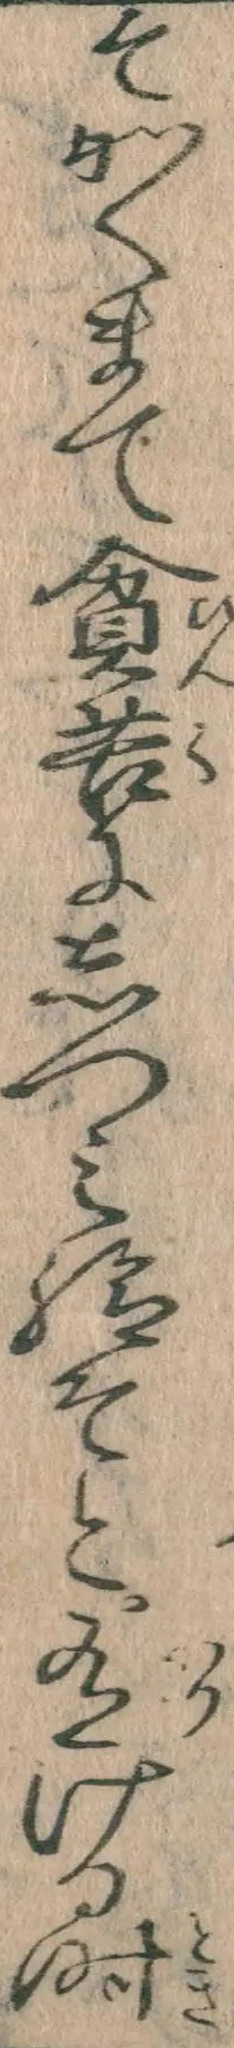そかくまて貧苦にしつみ給そと。有ける時
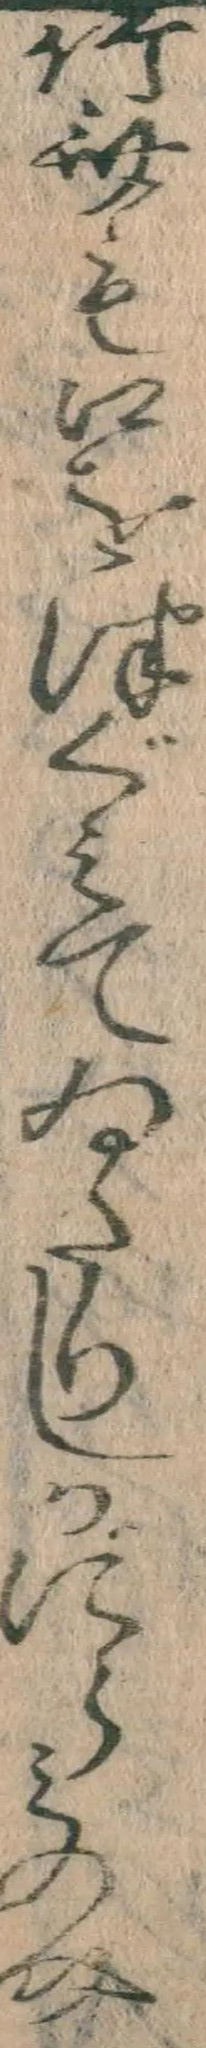竹斎も口をつぐみてゐたりしか。にらみの介
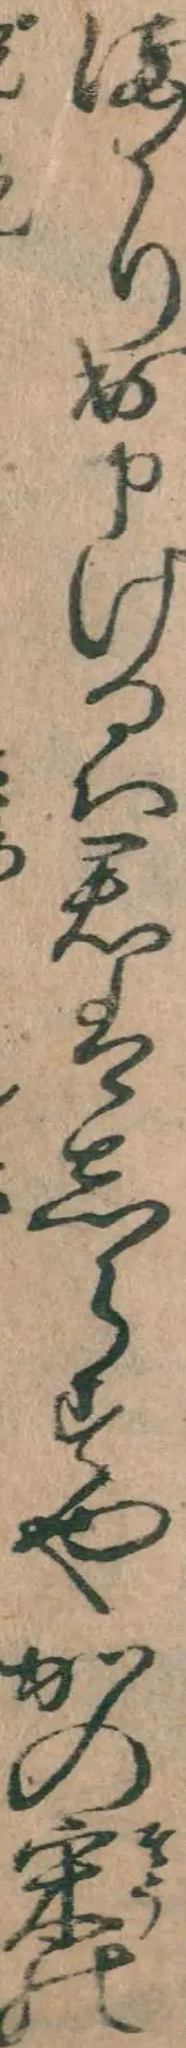まかり出申けるは君はしらすやかの宋の
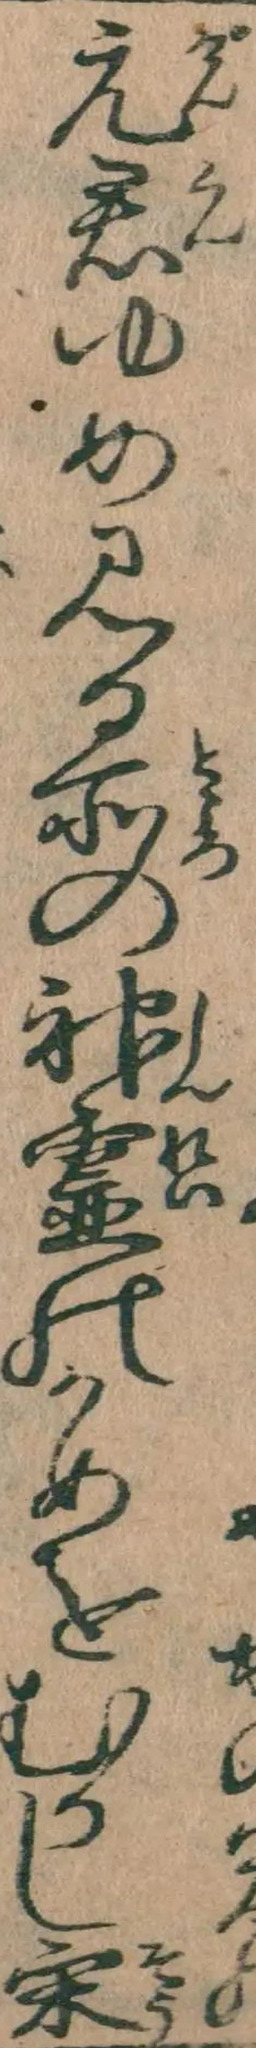元君ゆめ見る所の神霊のかめをむかし宋
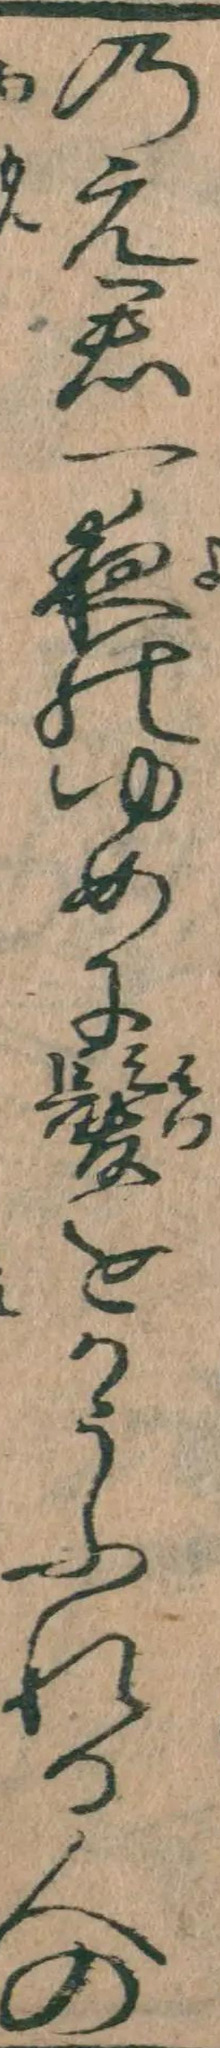の元君一夜のゆめに髪をかうふれる人の
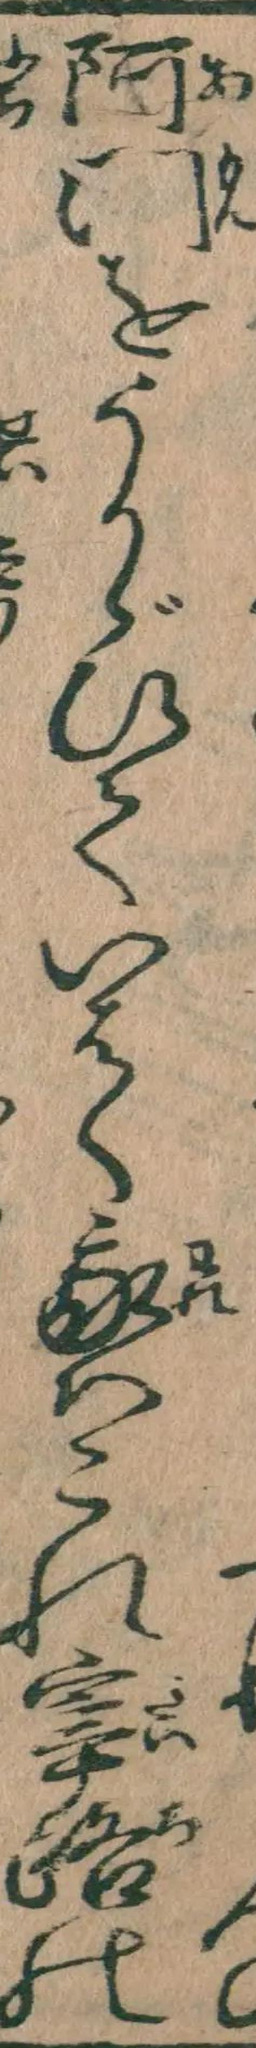阿門をうかゞひていはく我はこれ宰路の
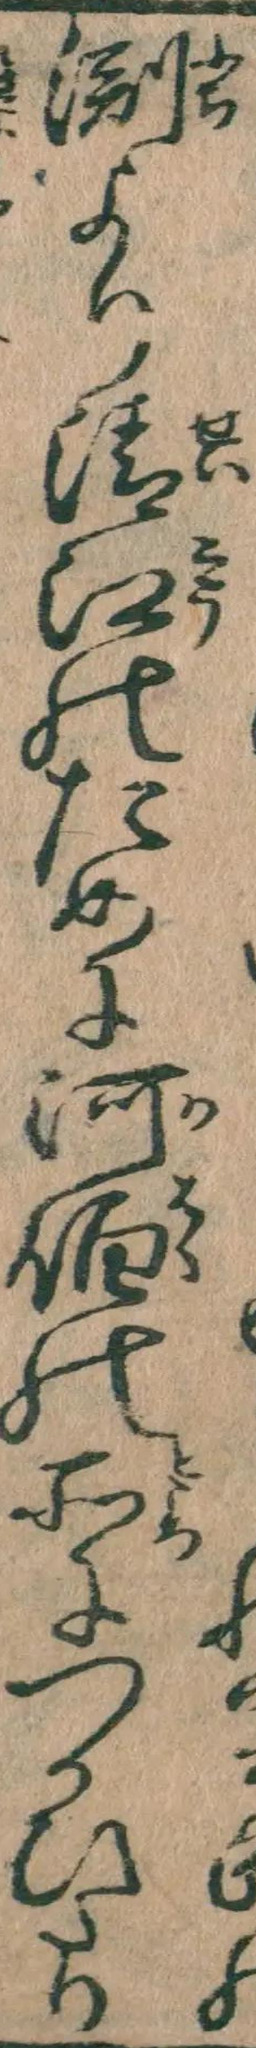淵より清江のために河伯の所につかひたり
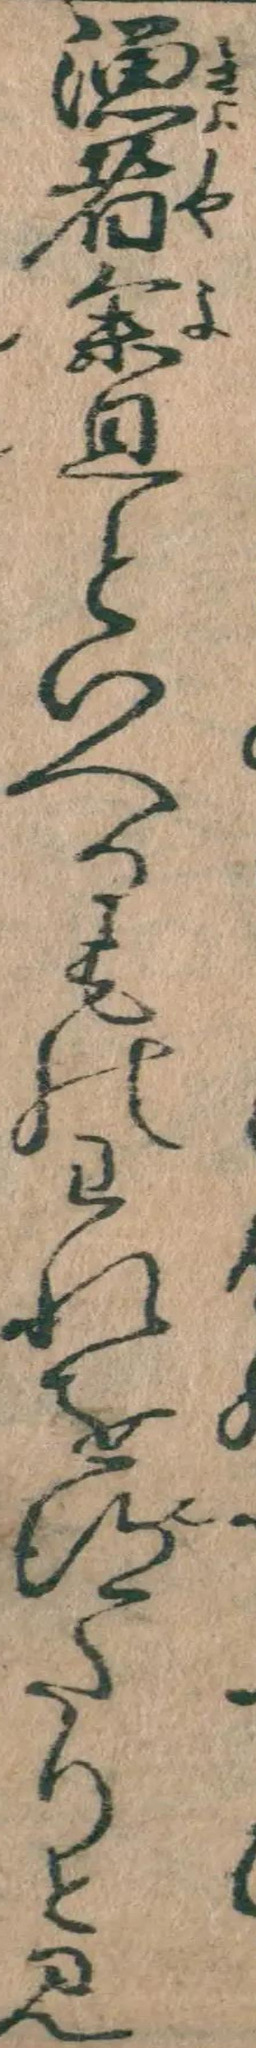漁者余旦といへるものわれを得たりと見
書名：竹斎狂歌物語 3巻
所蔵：国立国会図書館 National Diet Library, JAPAN
